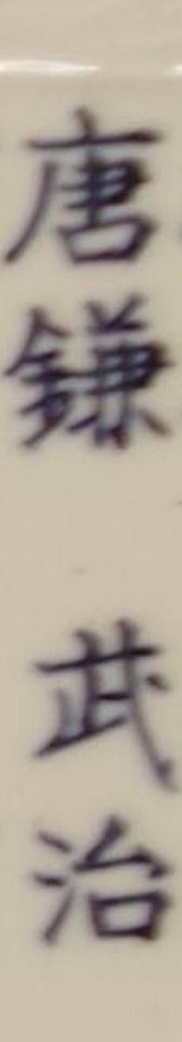唐鎌武治
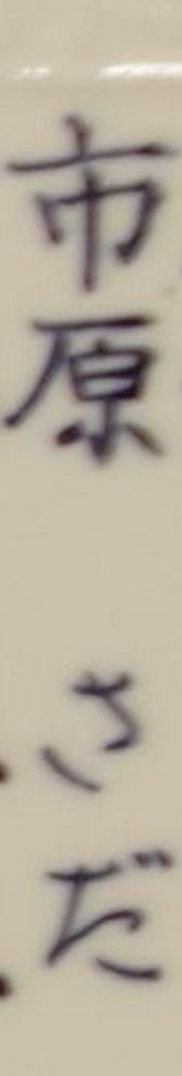市原さだ
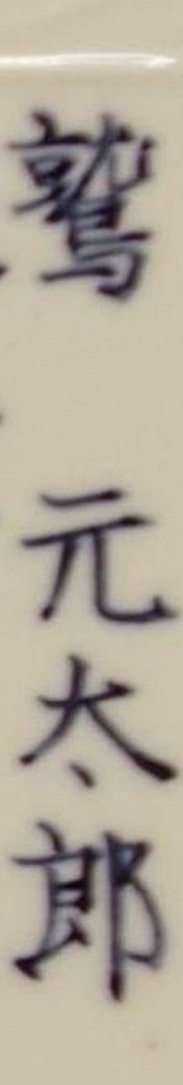鷲元太郎
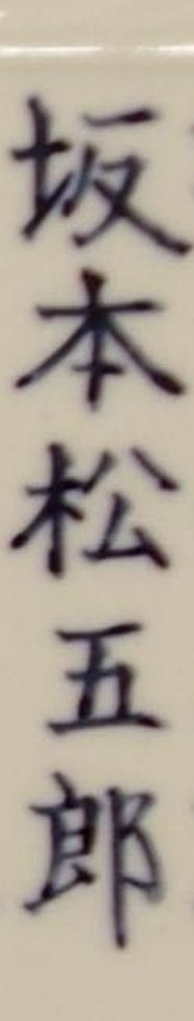坂本松五郎
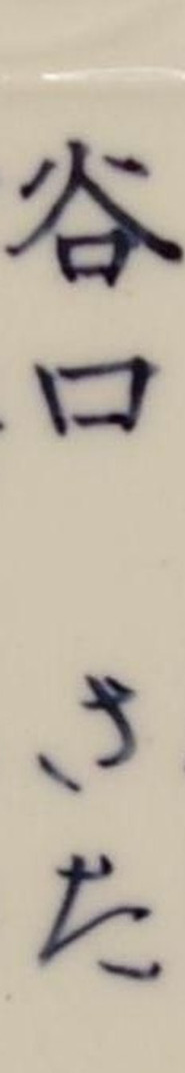谷口さた
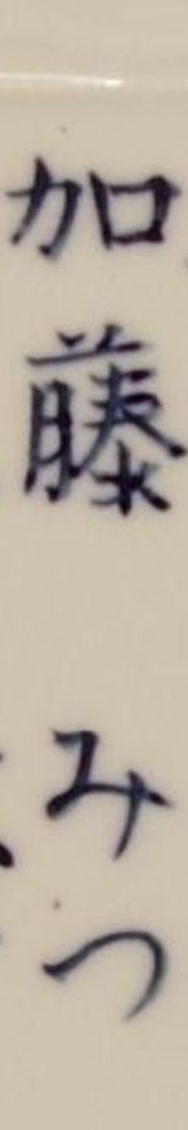加藤みつ
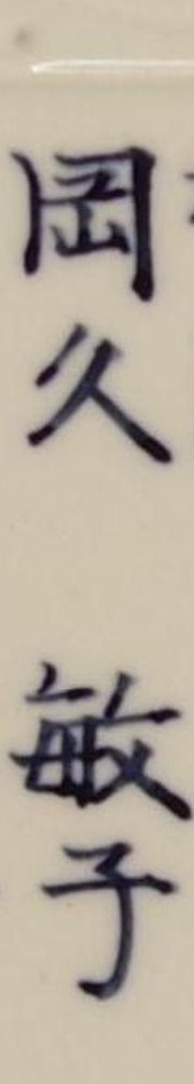岡久敏子
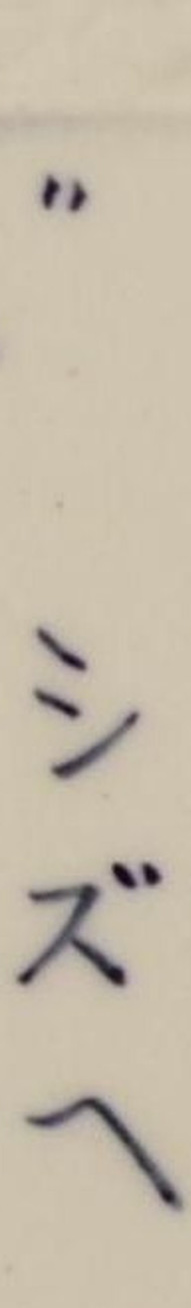シズヘ
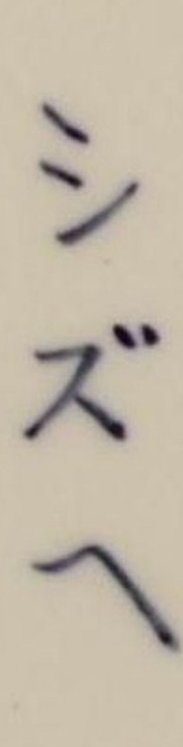シズヘ
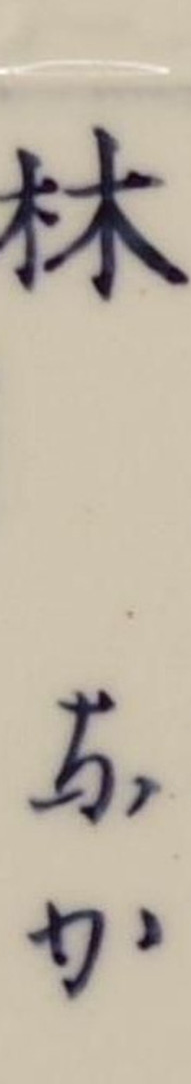林なか
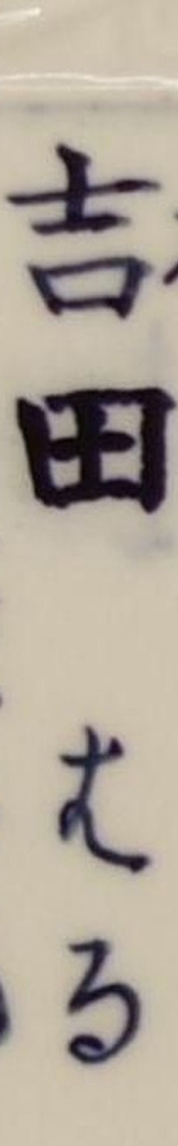吉田はる
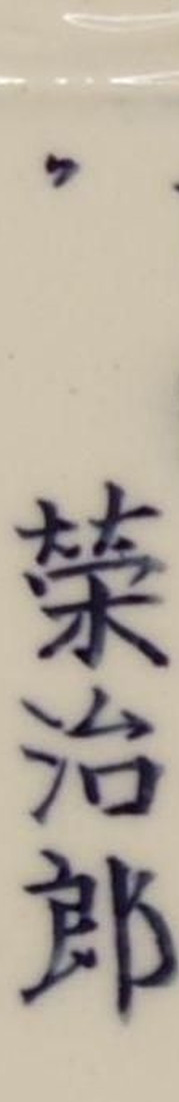榮治郎
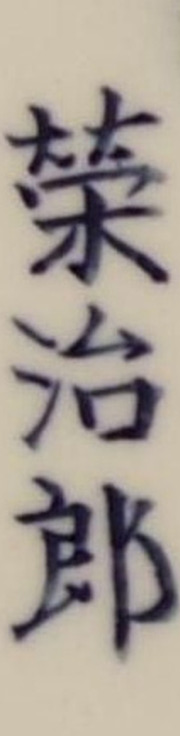榮治郎

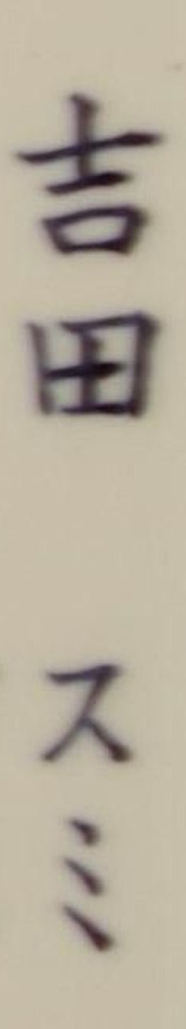吉田スミ
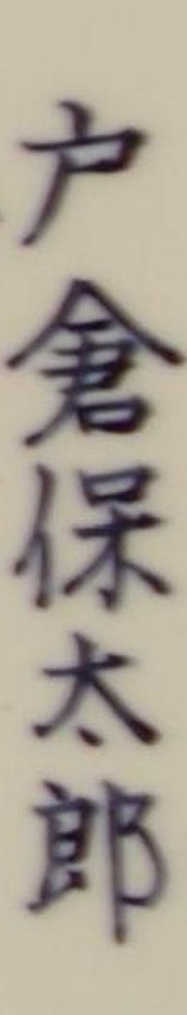戸倉保太郎
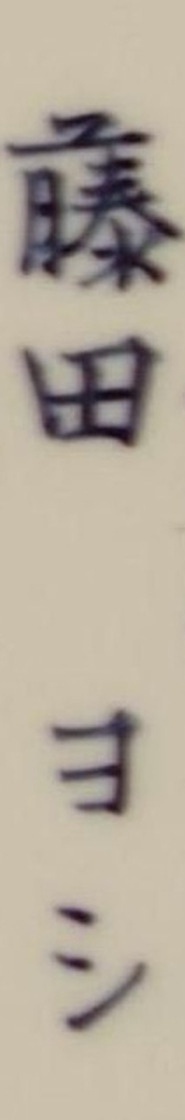藤田ヨシ
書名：M~S
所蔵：高野山金剛峯寺
